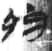於
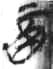梄（酉）
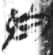於
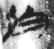於
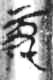亥
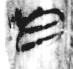於
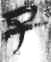子
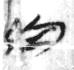於
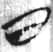日
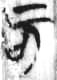可
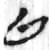㠯（以）
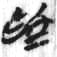爲
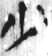少（小）
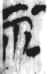{示工}（攻）
